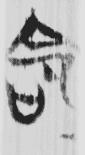命
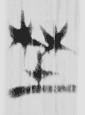埜
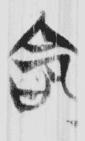命
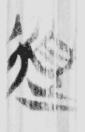道
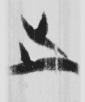之
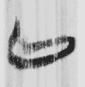㠯（以）
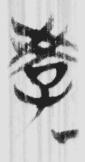𡥈
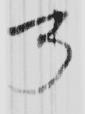乃
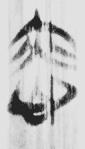{心亦}
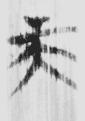天
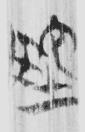地
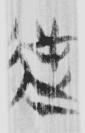逆
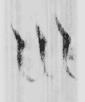川
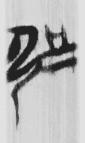{弓口二}
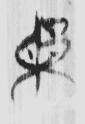柔
